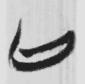㠯（以）
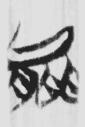能
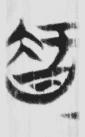智
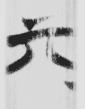亓
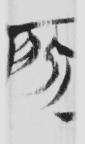所
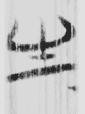{生}
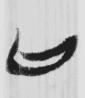㠯（以）
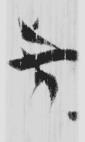先
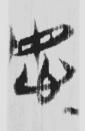悔
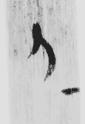人
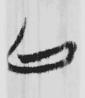㠯（以）
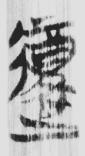{後口}
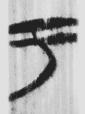于
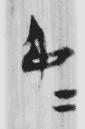身=
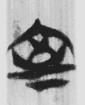室
